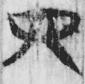四
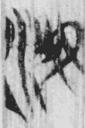○（海）
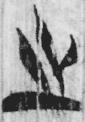之
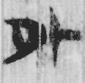外
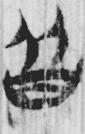皆
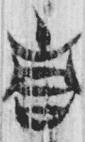青（請）
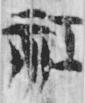○（貢）
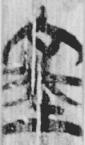○（禹）
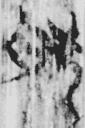肰（然）
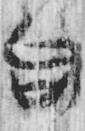句（後）
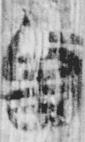○（始）
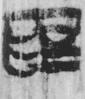爲
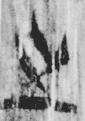之
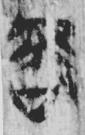唬（號）
